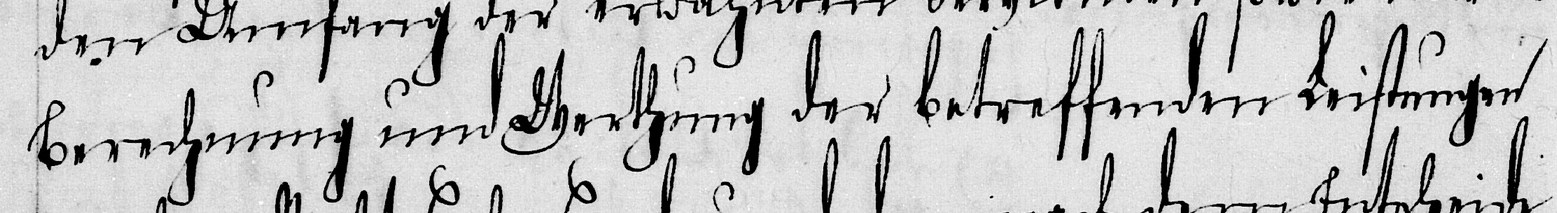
Berechnung und Werthung der betreffenden Leistungen
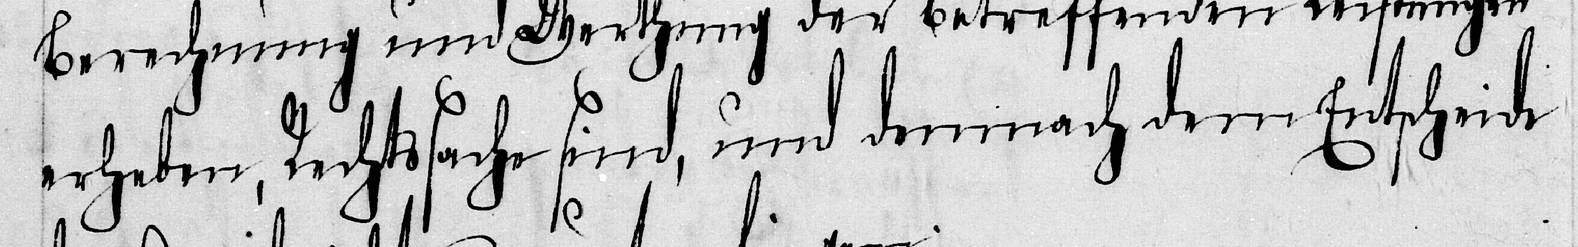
Rechtssache sind, und demnach dem Entscheide
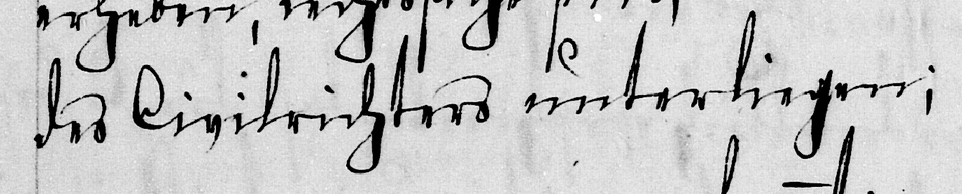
des Civilrichters unterliegen;
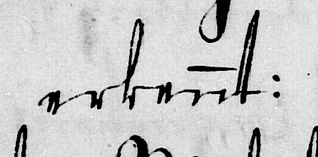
erkennt:
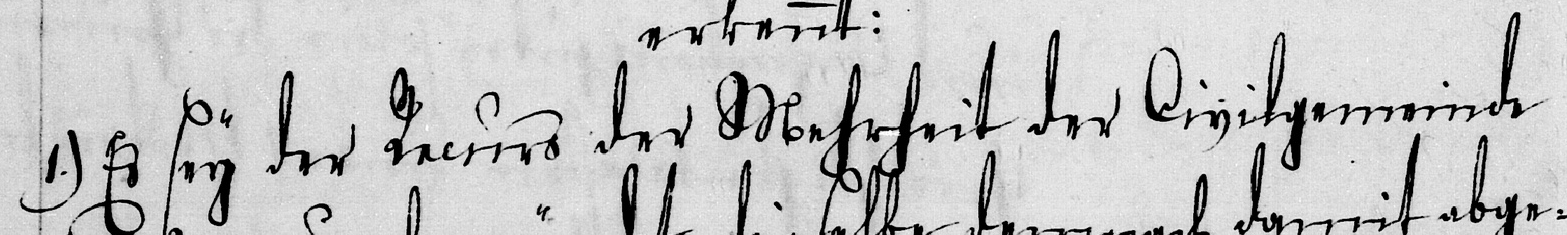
1.) Es sey der Recurs der Mehrheit der Civilgemeinde
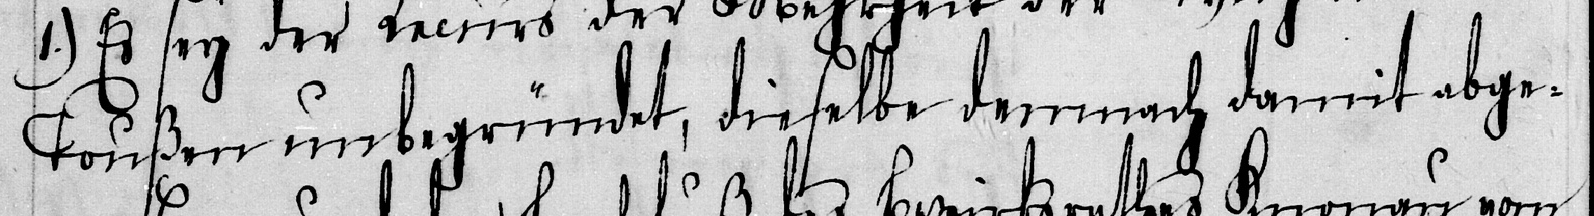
Toußen unbegründet, dieselbe demnach damit abge¬
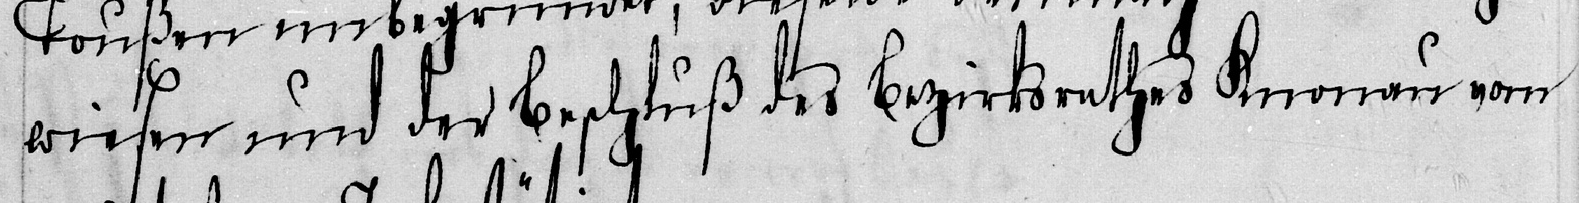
wiesen und der Beschluß des Bezirksrathes Knonau vom
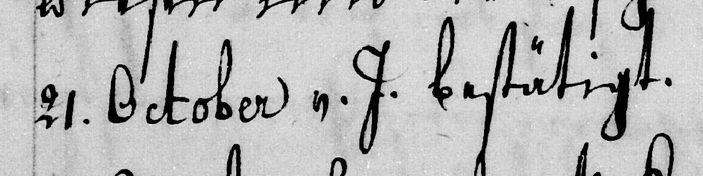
21. October v. J. bestätigt.
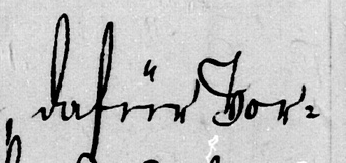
dafür Vor¬
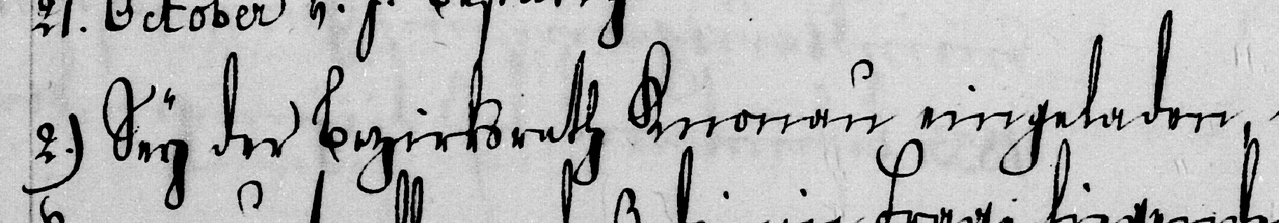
2.) Sey der Bezirksrath Knonau eingeladen,
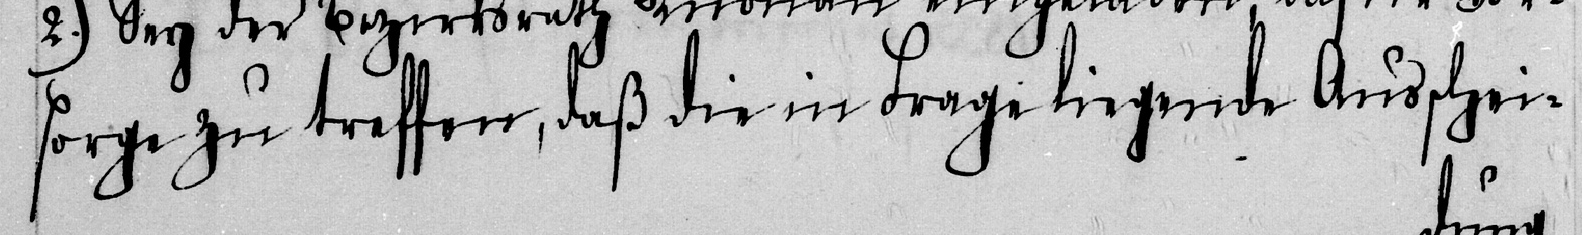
sorge zu treffen, daß die in Frage liegende Ausschei-
